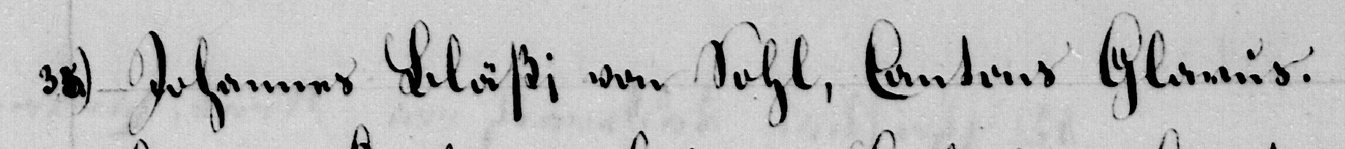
35.) Johannes Bläßi von Sohl, Cantons Glarus.
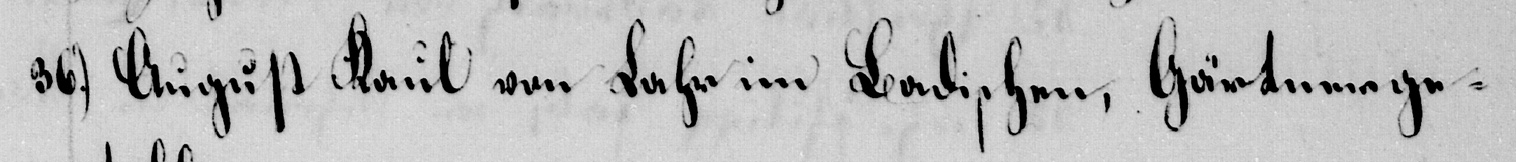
36.) August Kaul von Lahr im Badischen, Gärtnerge¬
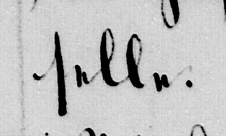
selle.
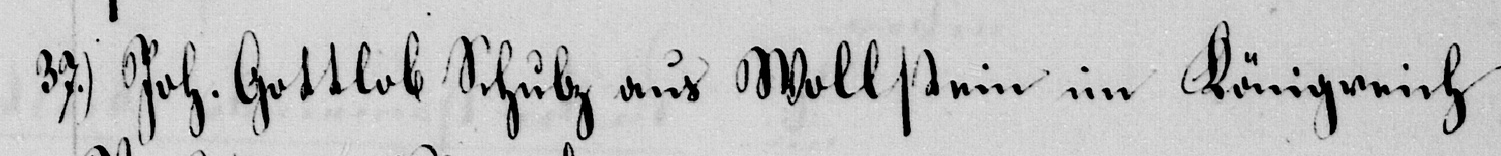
37.) Joh. Gottlieb Schulz aus Mollstein im Königreich
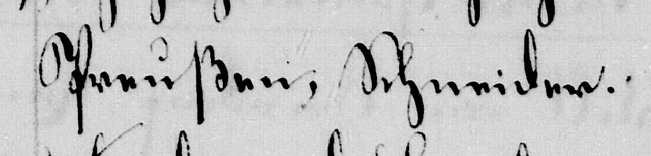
Preußen, Schneider.
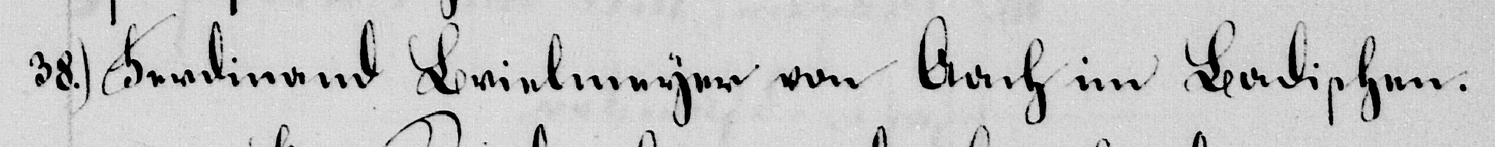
38.) Ferdinand Frielmeyer von Aach im Badischen.
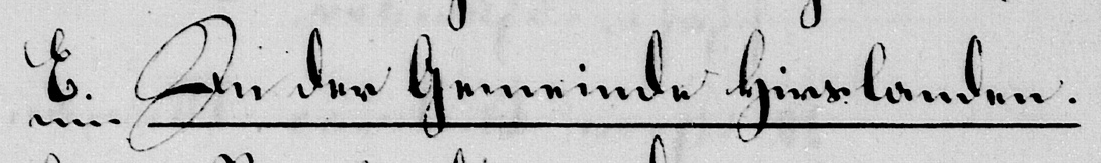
E. In der Gemeinde Hirslanden.
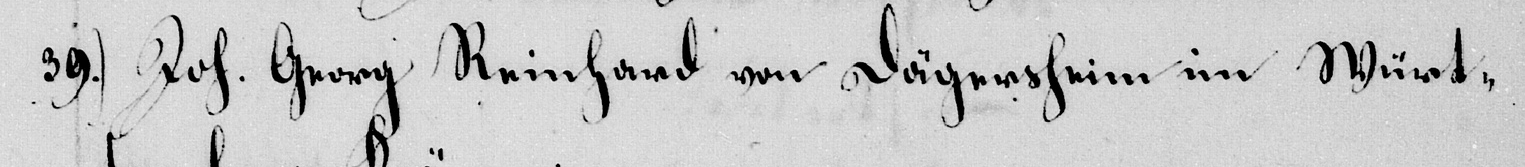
39.) Joh. Georg Reinhard von Dägersheim im Würt¬
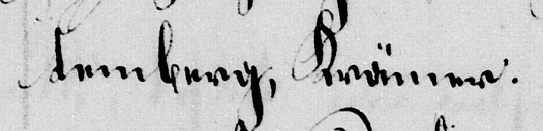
temberg, Krämer.
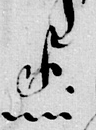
F.
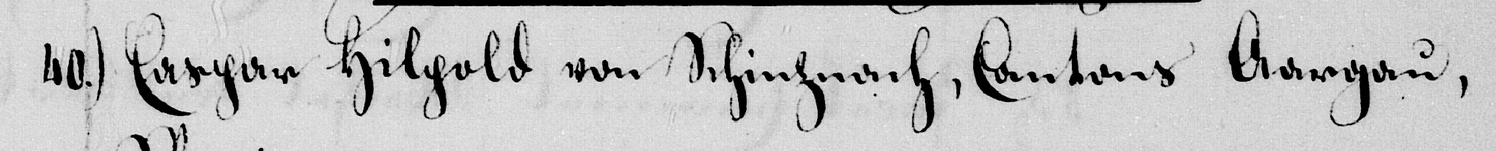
40.) Caspar Hilgold von Schinznach, Cantons Aargau,
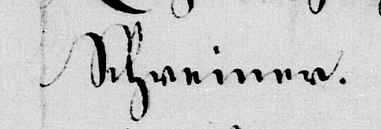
Schreiner.
